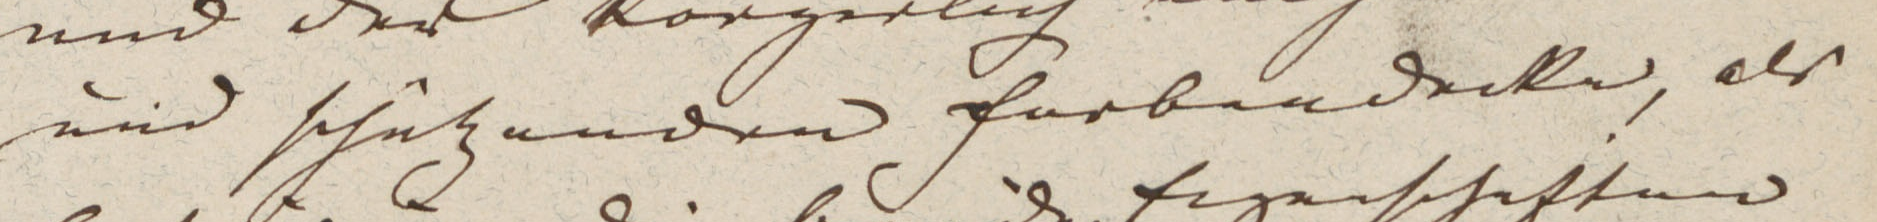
und schützenden Farbendecke, als
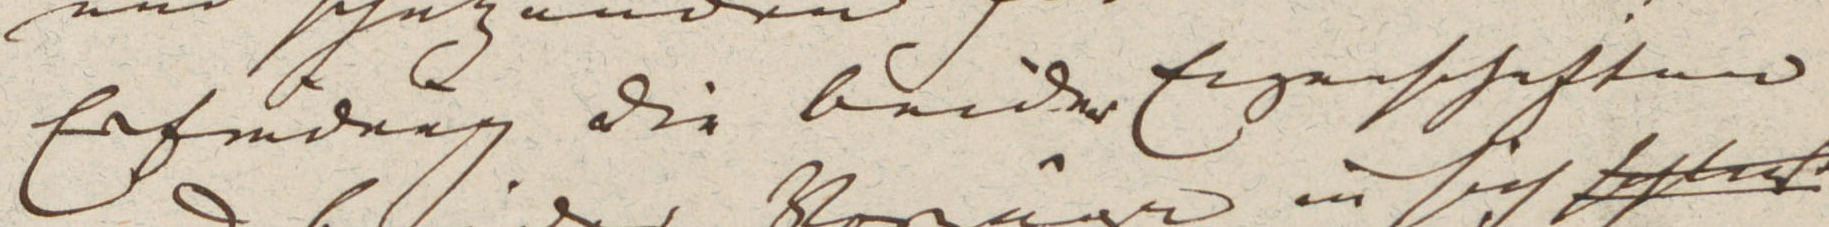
Erfindung die beider Eigenschaften
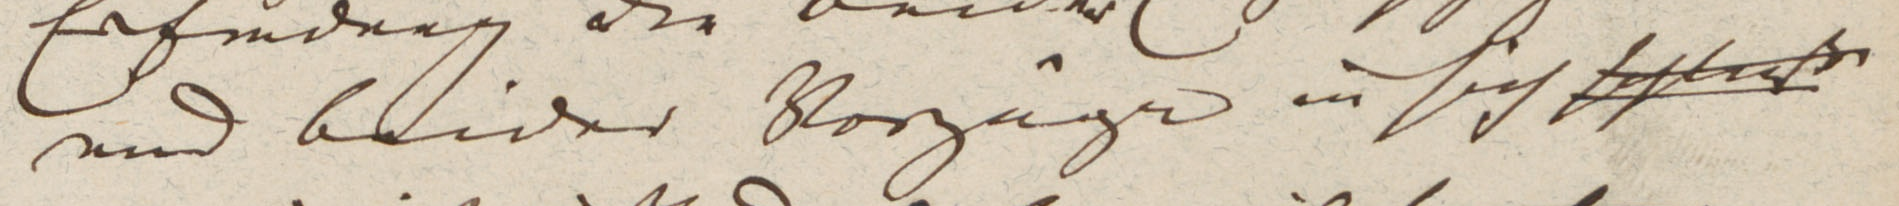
und beider Vorzüge in sich schliess
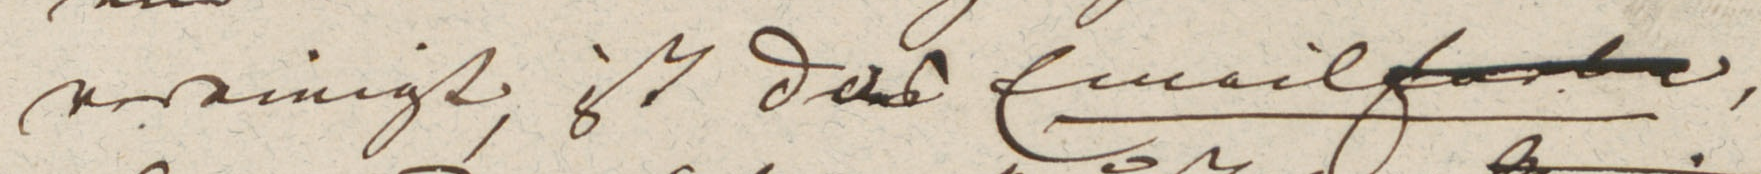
vereinigt, ist dieas Emailfarbe,
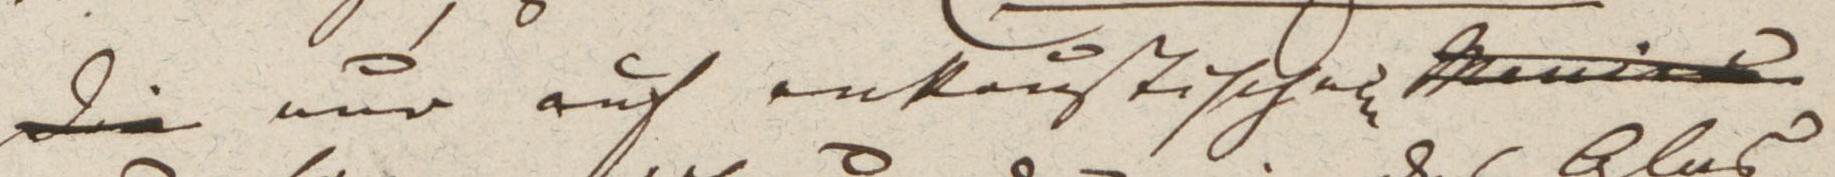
die nur auf enkaustischem Manier
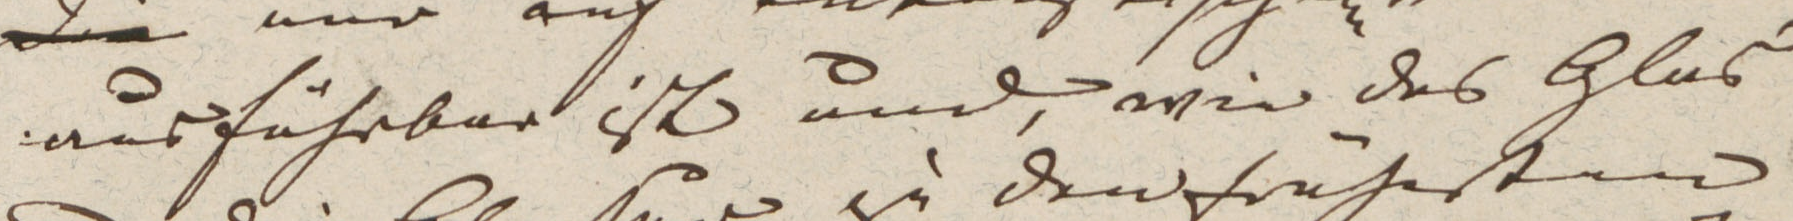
ausführbar ist und, wie das Glas
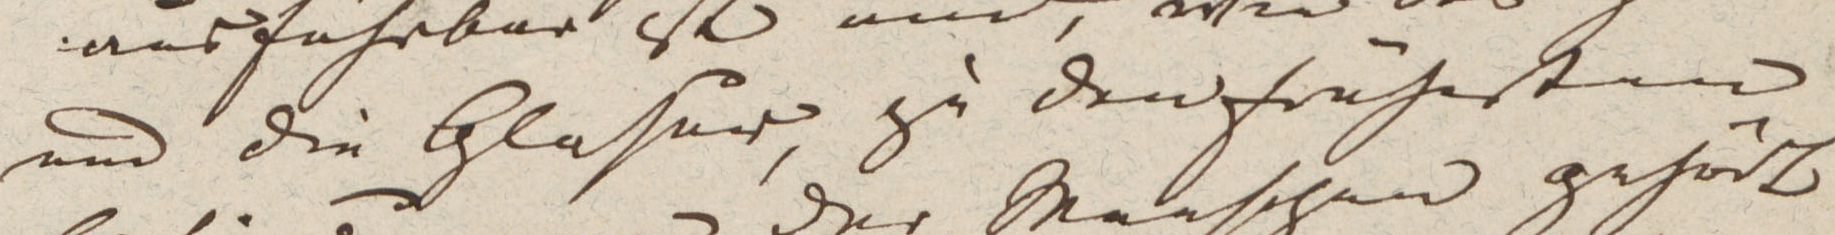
und die Glasur, zu den frühesten
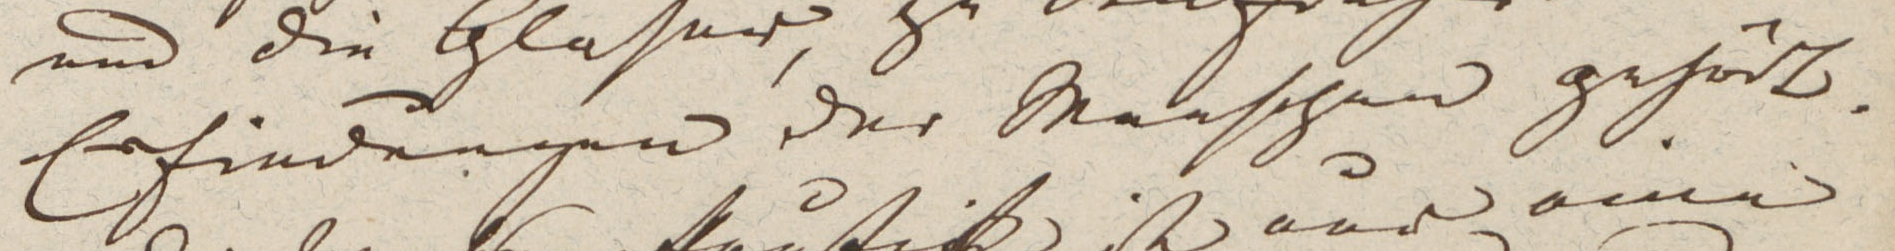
Erfindungen der Menschen gehört.
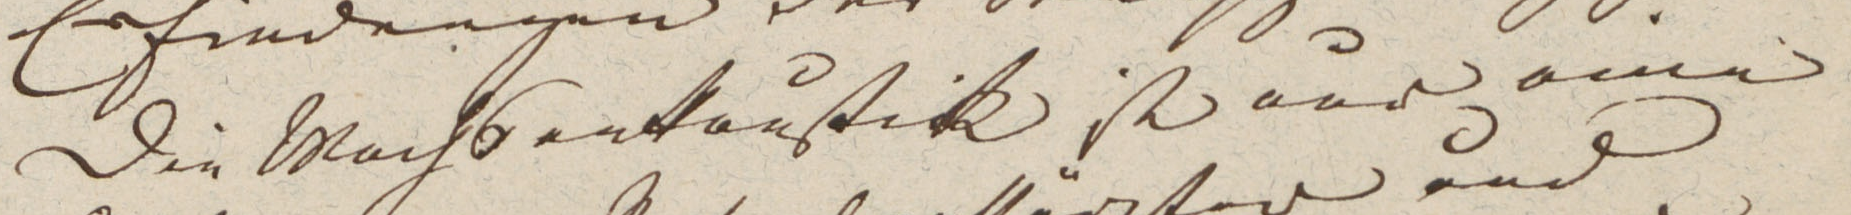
Die Wachsenkaustik ist nur eine
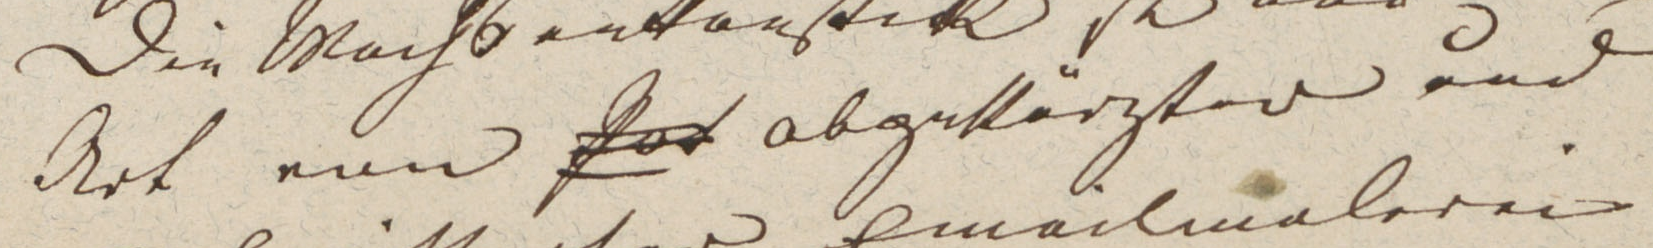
Art von Pot abgekürzter und
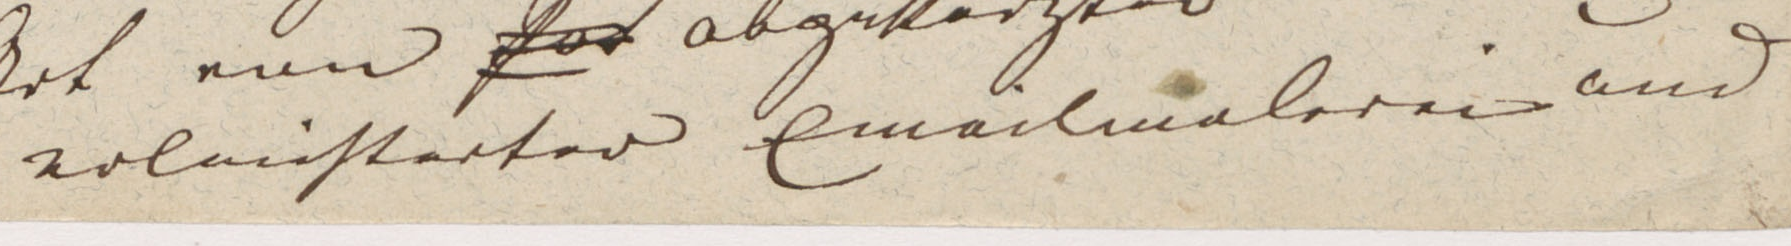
erleichterter Emailmalerei und
